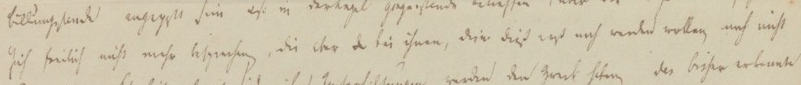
sich freilich nicht mehr besprechen, die aber bei ihnen, die dieß erst noch werden wollen, noch nicht
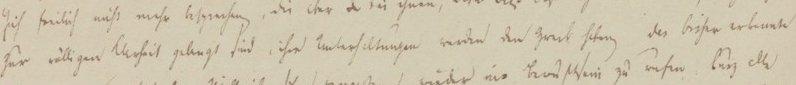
zur nöthigen Klarheit gelangt sind, ihre Unterhaltungen werden den Zweck haben, das bisher erkannte
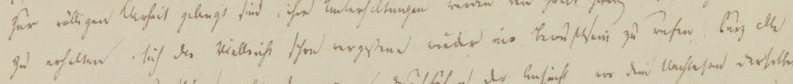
zu erhalten & sich das vielleicht schon vergeßene wieder ins Bewußtsein zu rufen, kurz alle
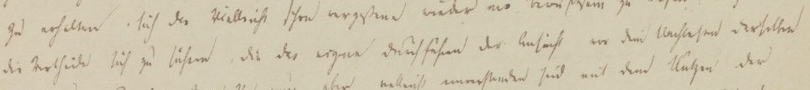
die Vortheile sich zu sichern, die das eigne Durchführen der Ansicht vor dem Nachlesen derselben
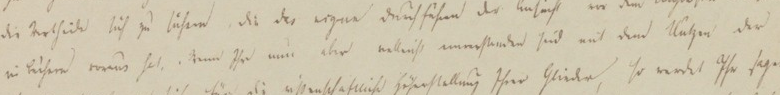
in Büchern voraus hat. Wenn Ihr nun aber vielleicht einverstanden seid mit dem Nutzen der
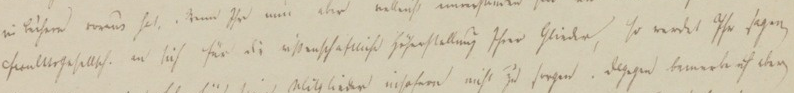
FaculttsGesellsch. an sich für die wissenschaftliche Höherstellung Ihrer Glieder, so werdet Ihr sagen,
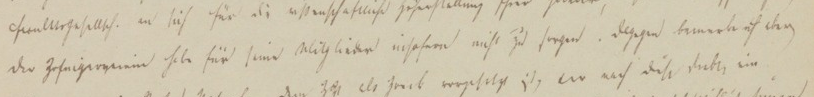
der Zofingerverein habe für seine Mitglieder insofern nicht zu sorgen. Dagegen bemerke ich aber,
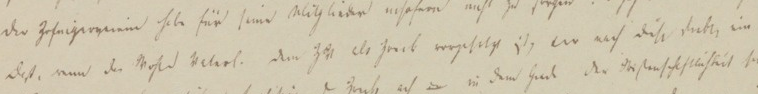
daß, wenn das Wohl d. Vaterl. dem ZV als Zweck vorgesetzt ist, & er nach diesem strebe, ein
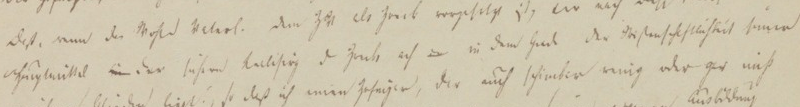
Hauptmittel der sichern Realisirg d. Zwecks auch in dem Grade der Wissenschaftlichkeit seiner
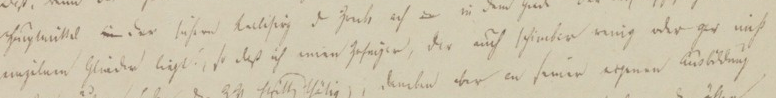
einzelnen Glieder liegt, so daß ich einen Zofinger, der auch scheinbar wenig oder gar nicht
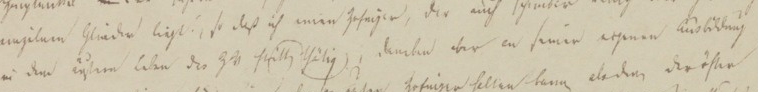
in dem äußern Leben des ZV fwillig thätig, daneben aber an seiner eigenen Ausbildung
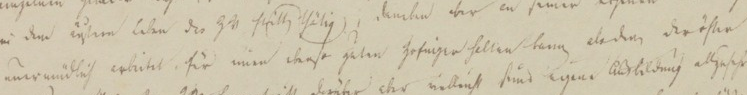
unermüdlich arbeitet, für einen ebenso guten Zofinger halten kann, als den, der öfter
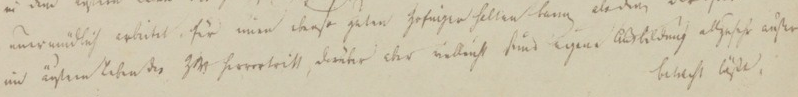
im äußern Leben des ZV hervortritt, darüber aber vielleicht seine eigene Ausbilung allzusehr außer
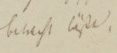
Betracht läßt.
